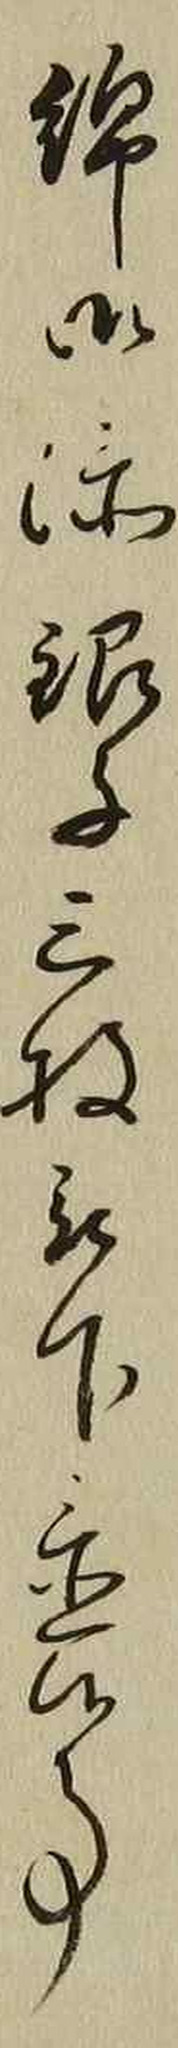綿御添銀子三枚被下置候事
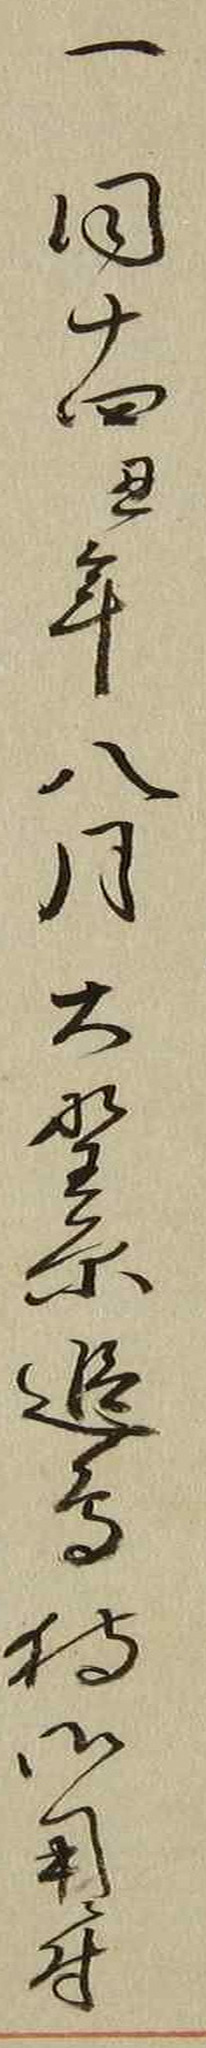一同十四丑年八月大野原追鳥狩御用に付
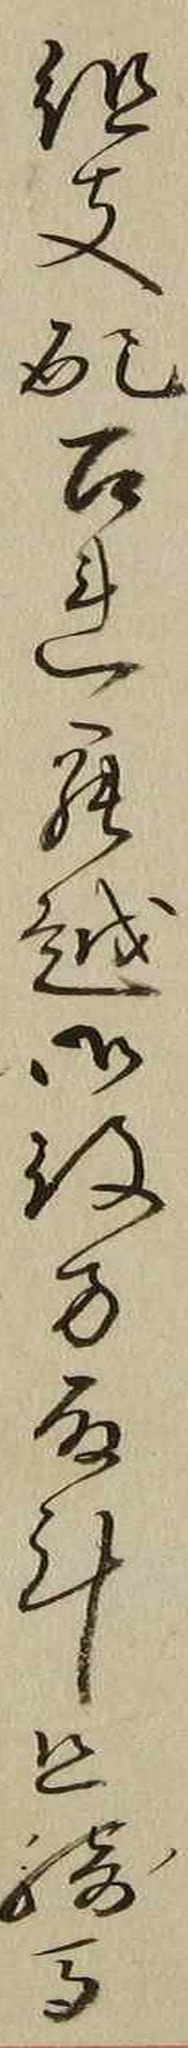組支配召連罷越御役方取計且騎馬
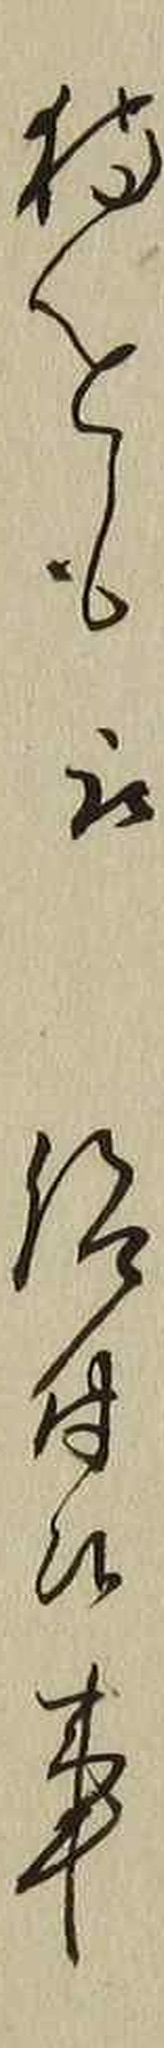狩をも被仰付候事
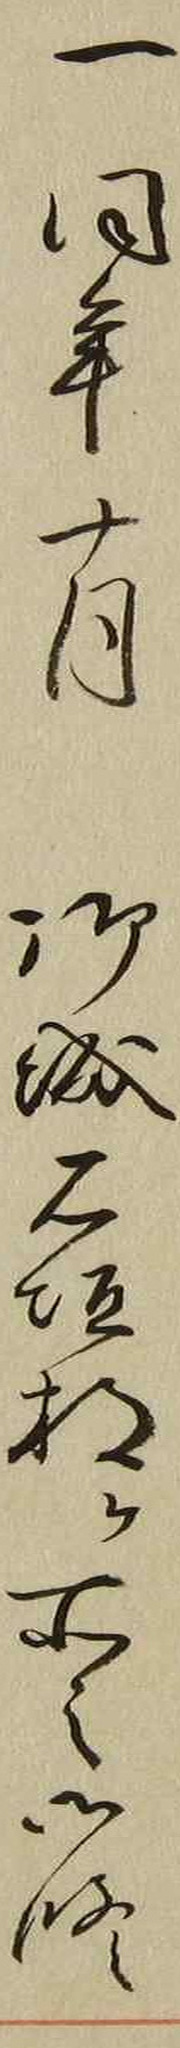一同年十月御城石垣数ケ所之御修
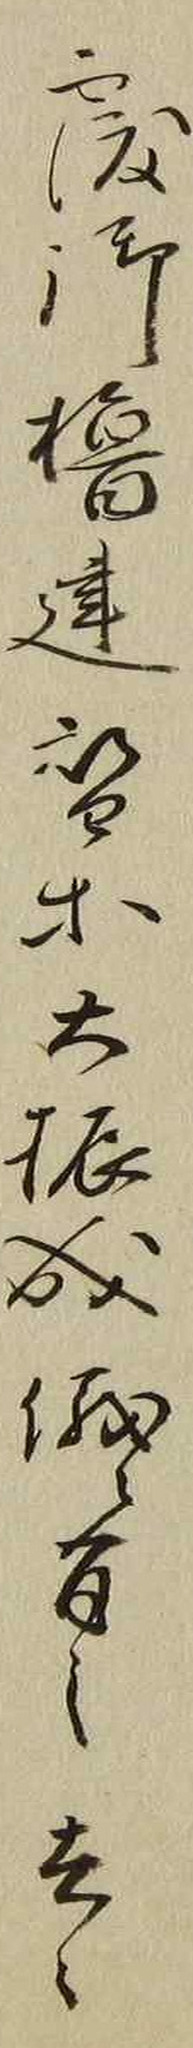覆御櫓建替等大振成儀に有之去々
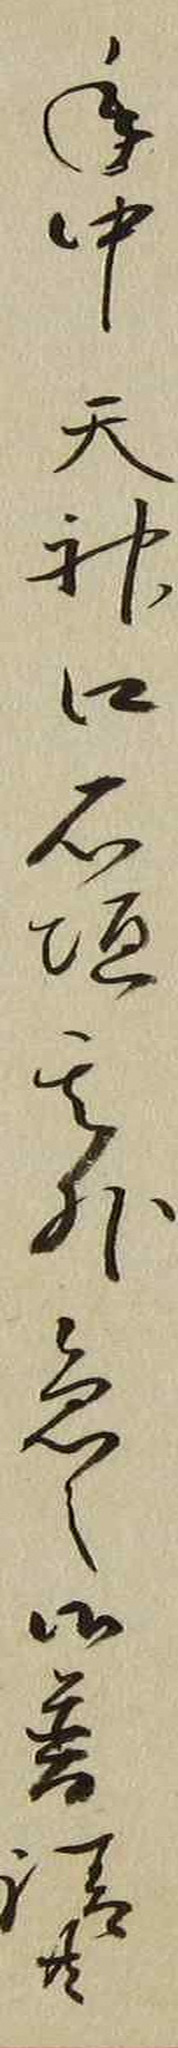年中天神口石垣其外急之御普請共
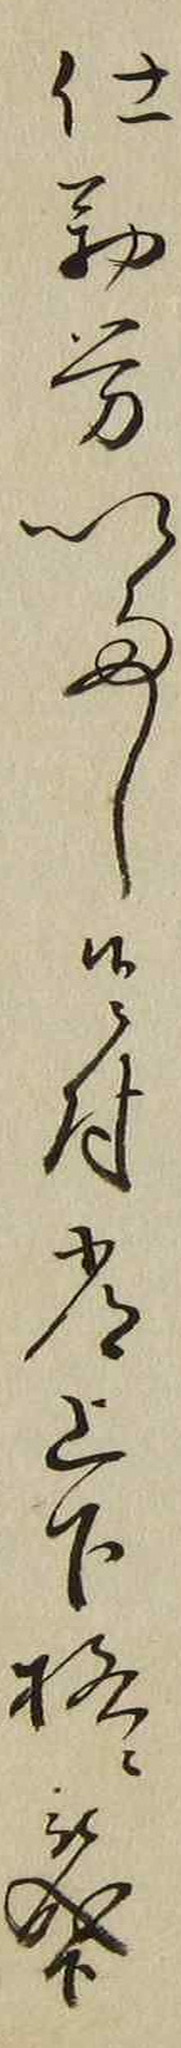仕勤労いたし候に付常上下格に被成下
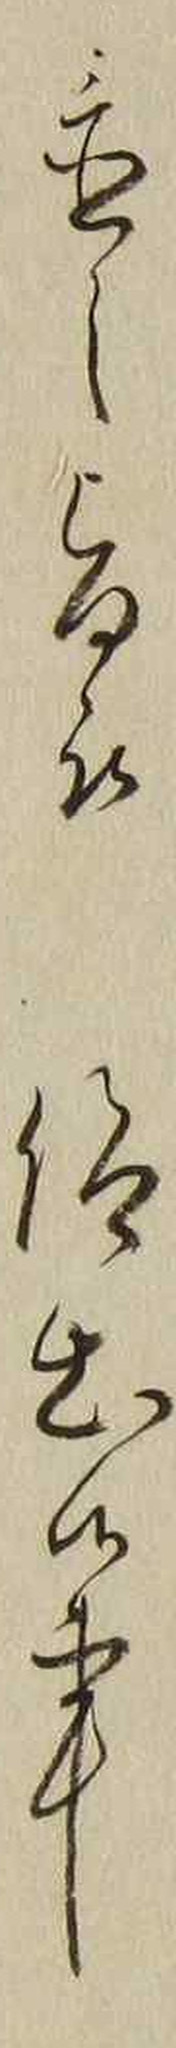置之旨被仰出候事

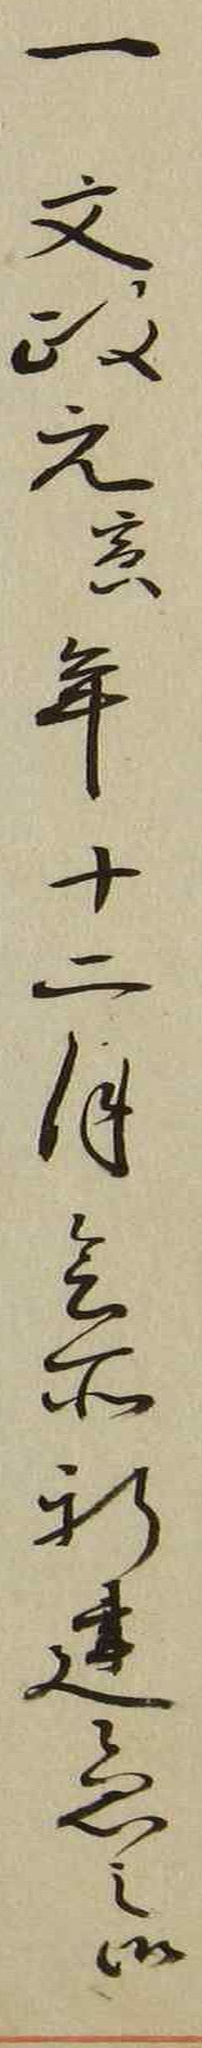一文政元寅年十二月会所新建急之御
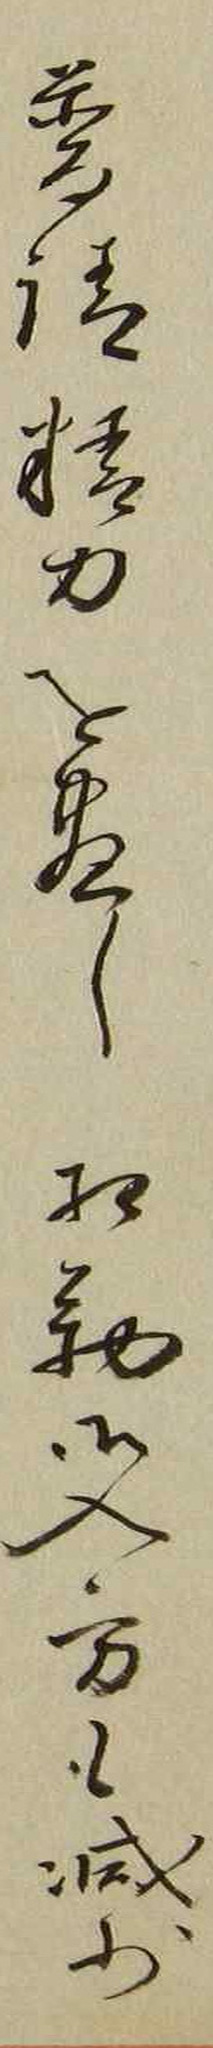普請精力を尽し相勤御入方も減少
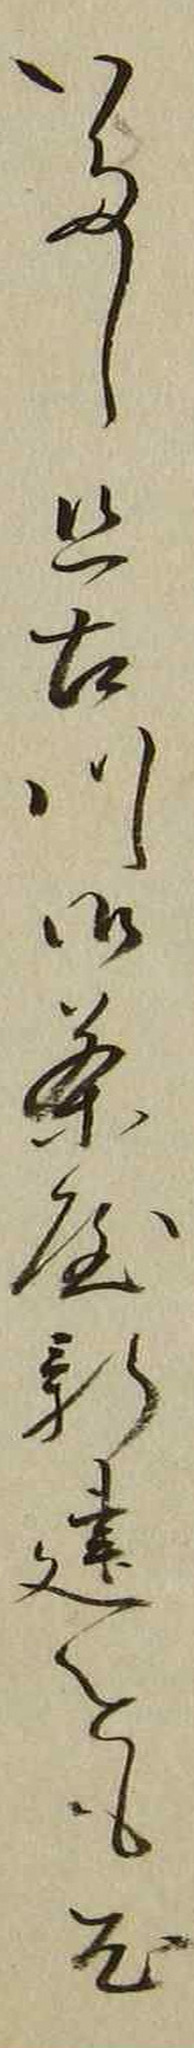いたし且古川御茶屋新建をも心
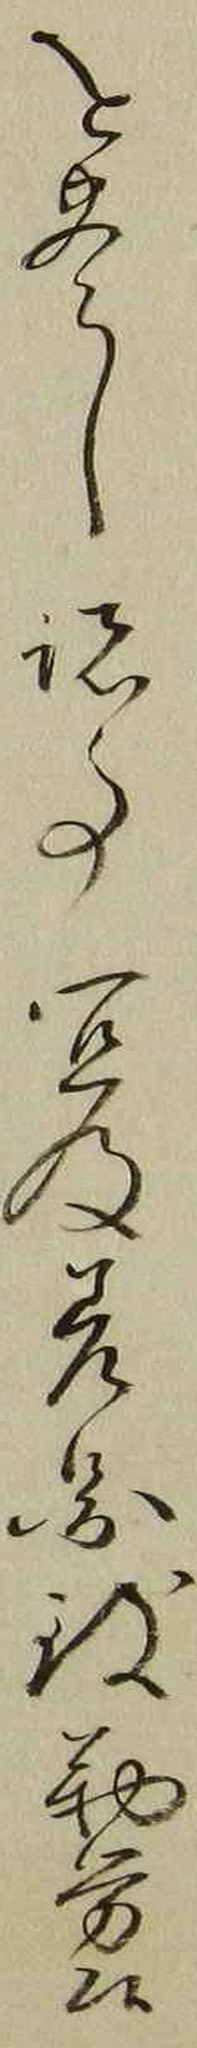を尽し諸事宜及差図致勤労候
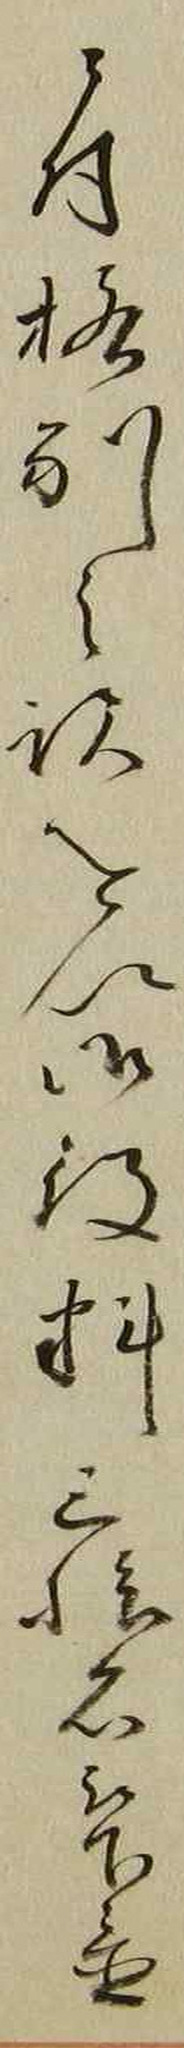に付格別之訳を以御役料三拾石被下置
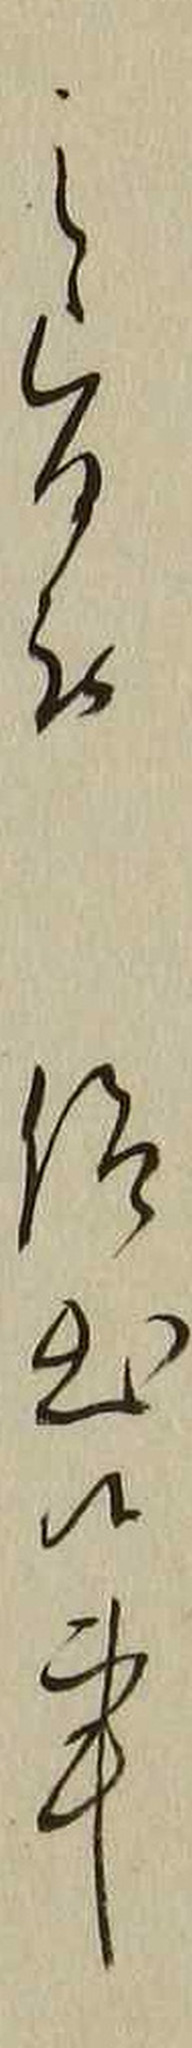之旨被仰出候事
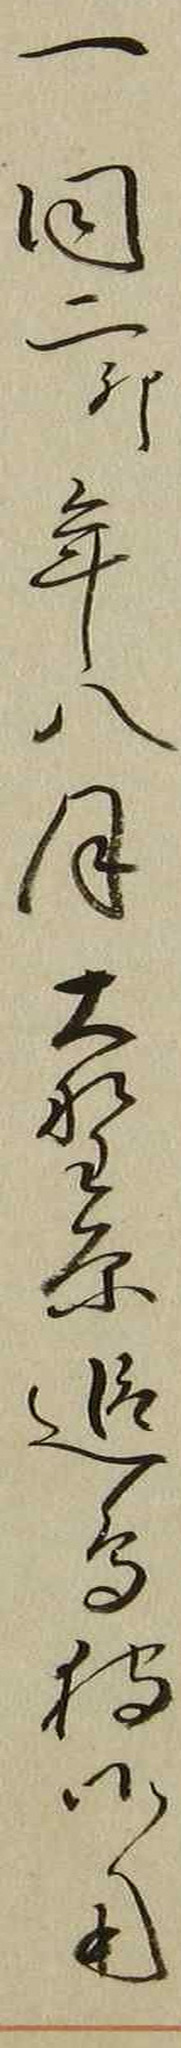一同二卯年八月大野原追鳥狩御用
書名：諸士系譜　巻之3　い之部3
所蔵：会津若松市立会津図書館
